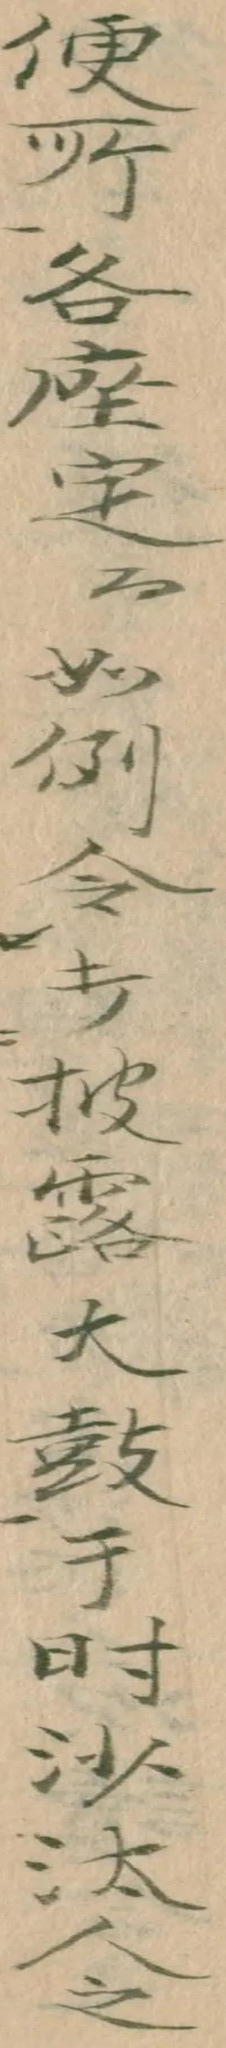便所各座定而如例令打披露大鼓于時沙汰人之

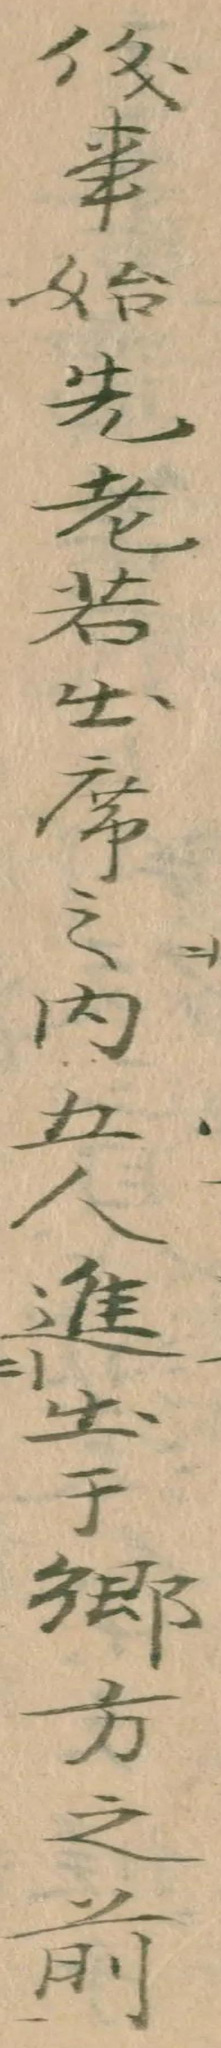儀事始先老若出席之内五人進-出于郷方之前
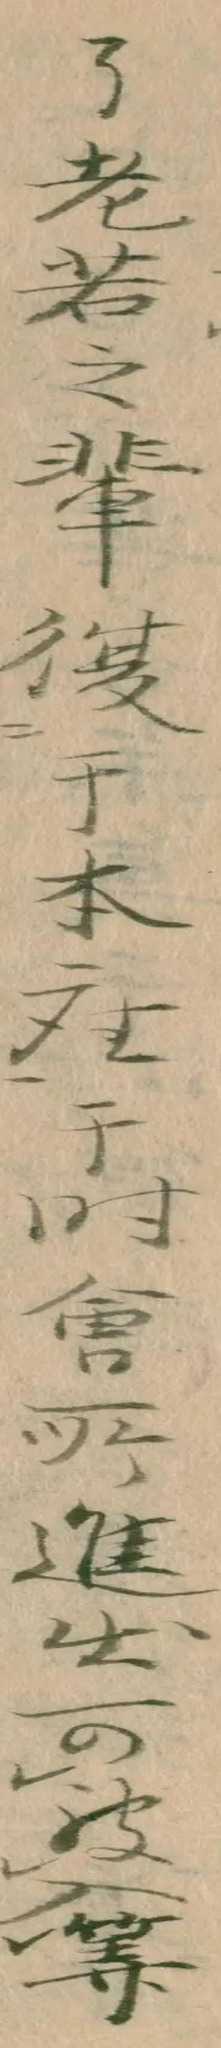了老若之輩復于本座于時会所進出可被入算
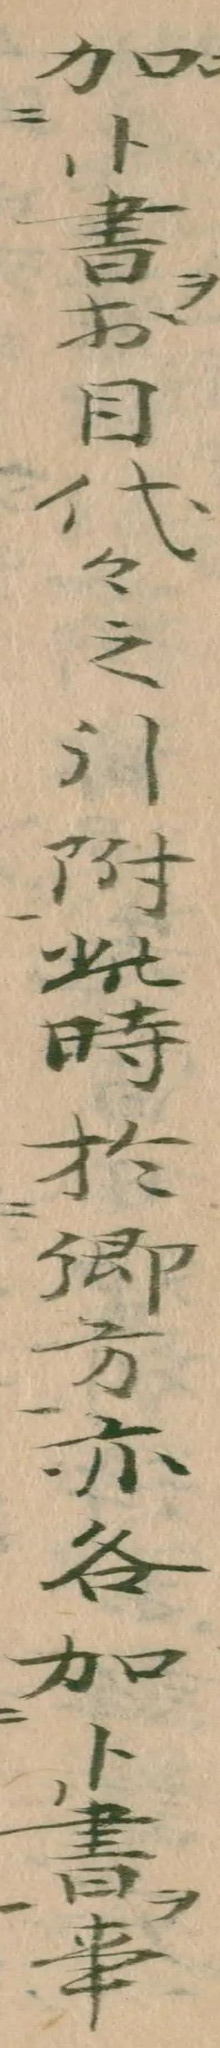加卜-書ヲ於目代々之引附此時於郷方亦各加卜-書ヲ事
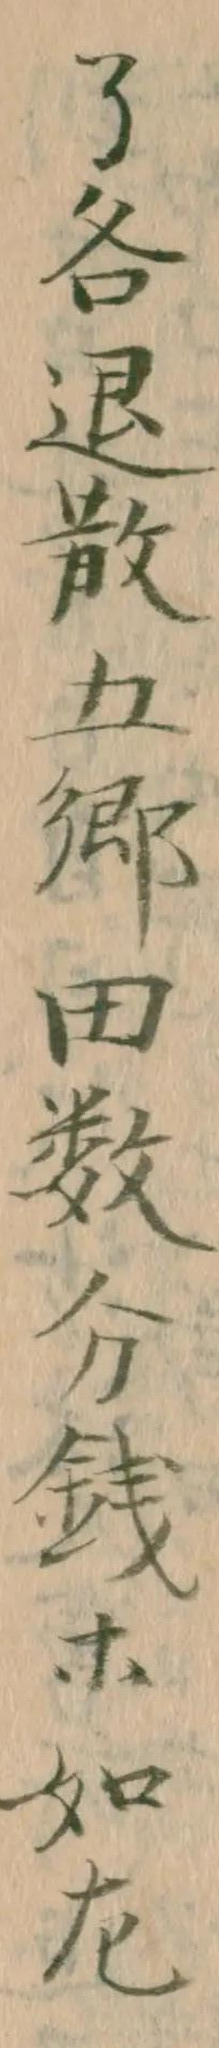了各退散五郷田数分銭等如左

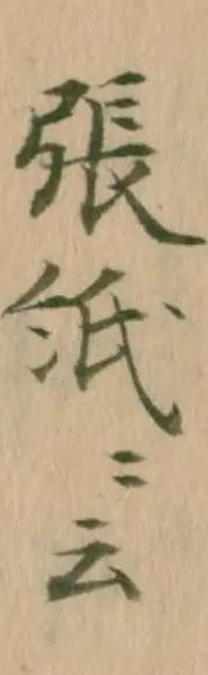張紙ニ云
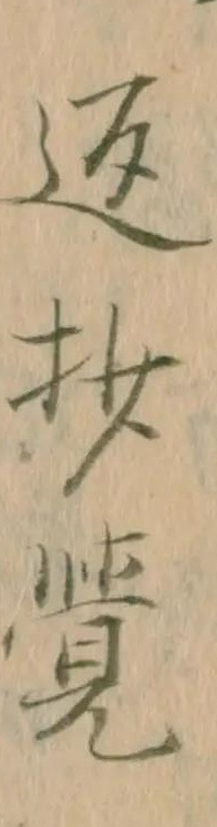返抄覚
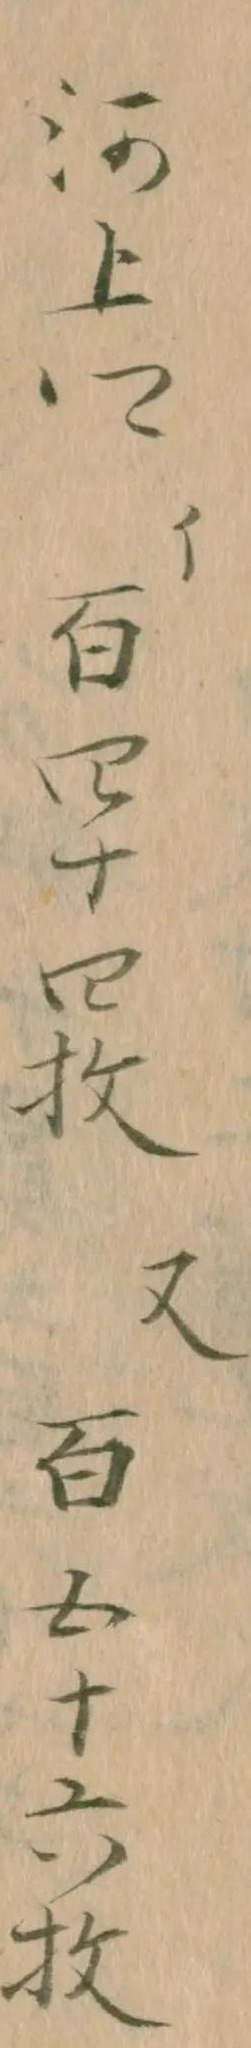河上郷百四十四枚百五十六枚
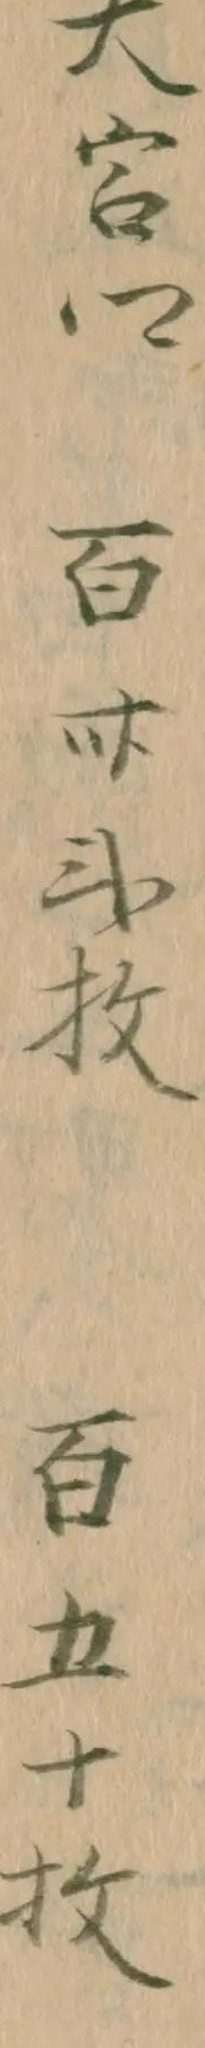大宮郷百卅弐枚百五十枚
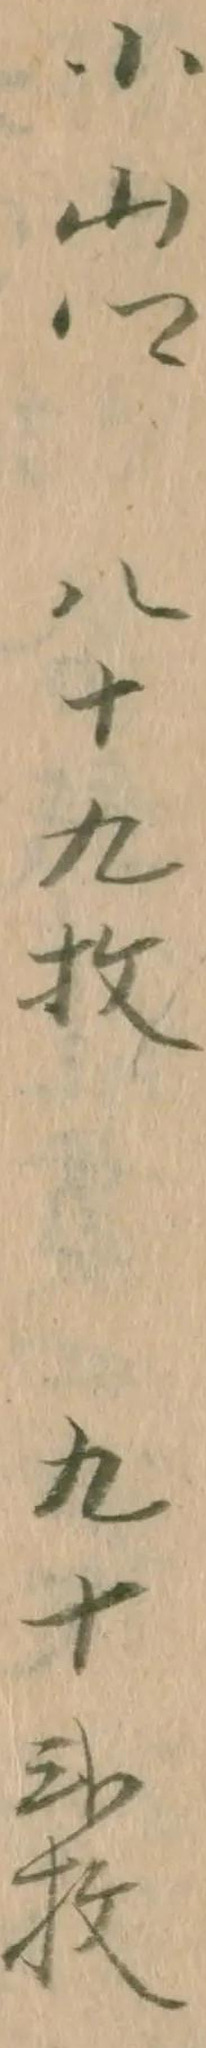小山郷八十九枚九十弐枚
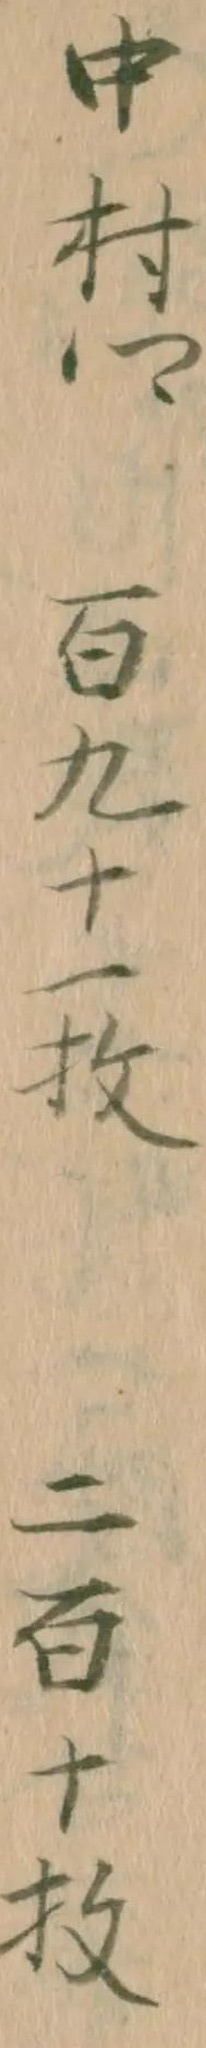中村郷百九十一枚二百十枚
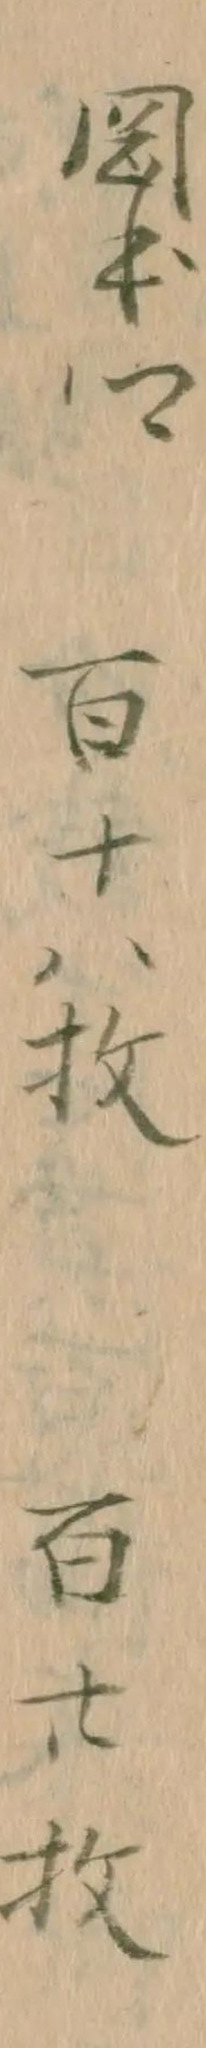岡本郷百十八枚百廿枚
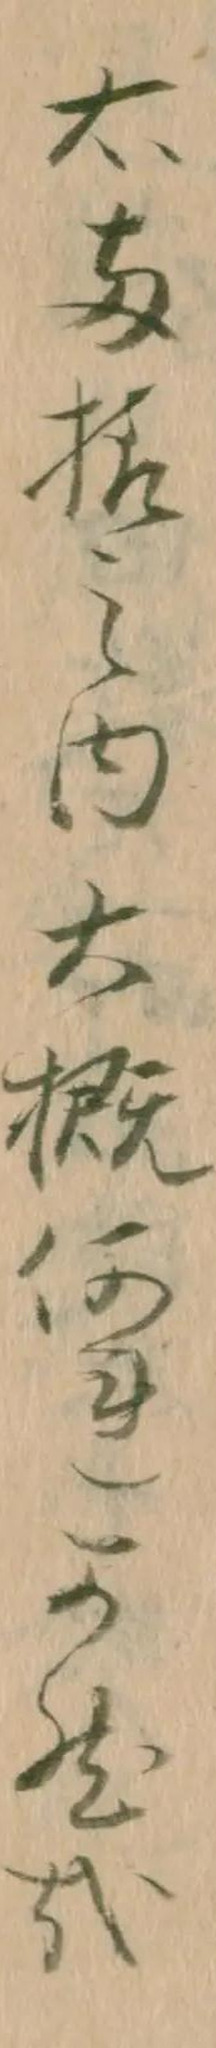右両様之内大概何れ可然哉
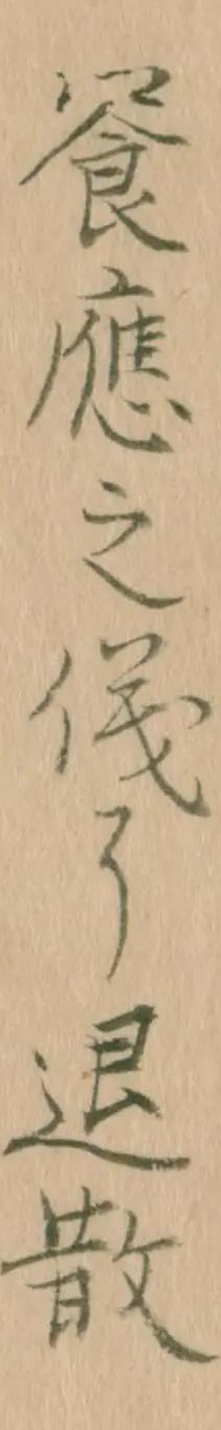饗応之儀了退散
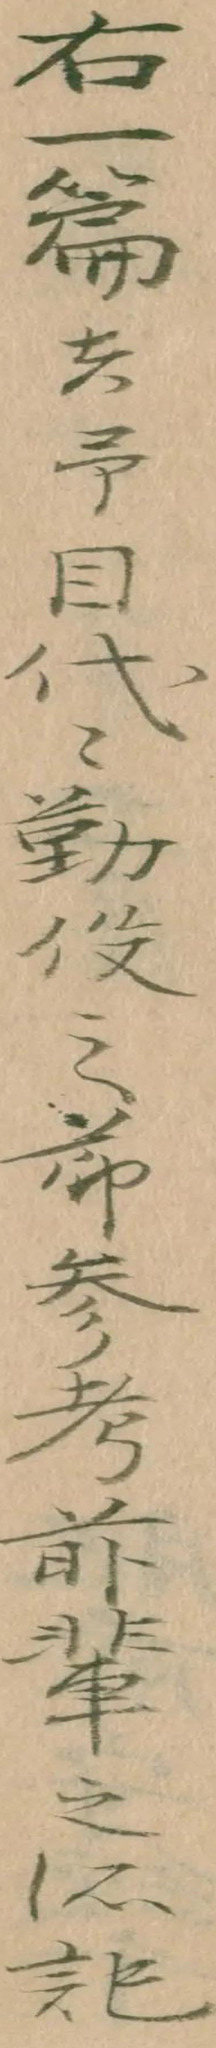右一篇は予目代々勤役之節参考前輩之所記
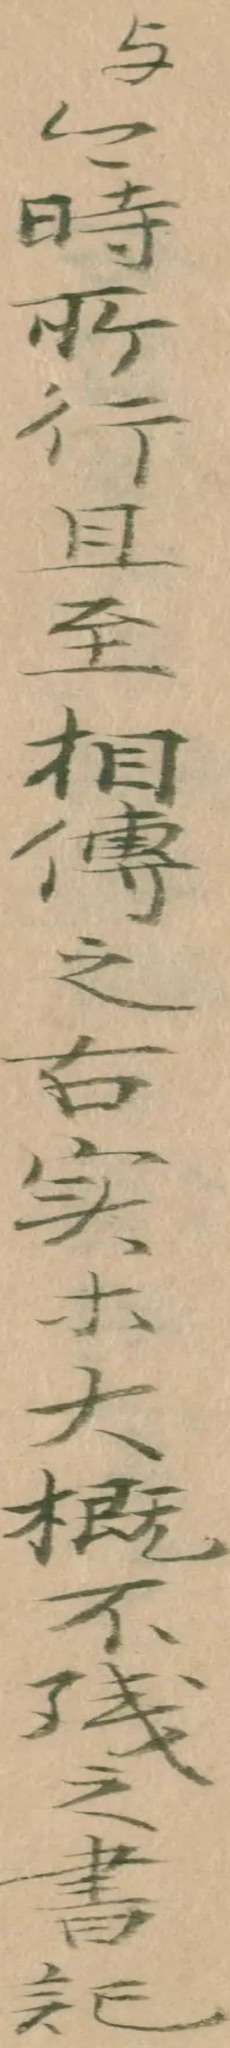与今時所行且至相伝之古実等大概不残之書記
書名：賀茂社記録. 第26冊
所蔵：国立国会図書館 National Diet Library, JAPAN
